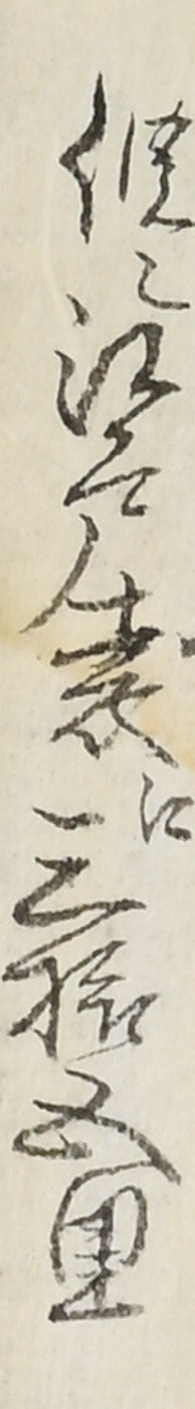但し江戸表え三拾五里

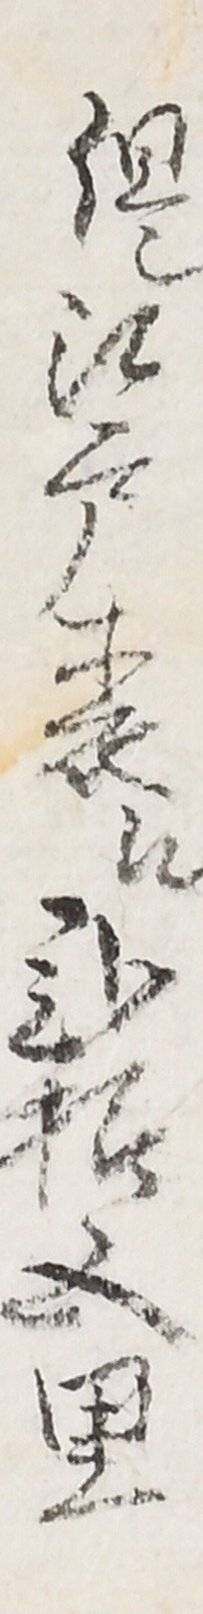但し江戸表え弐拾五里
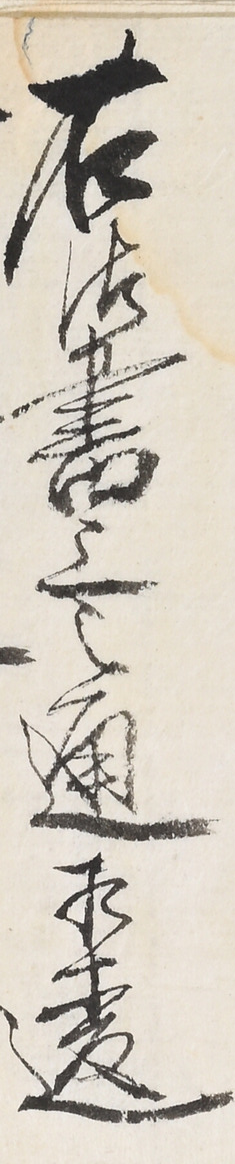右御書上之通相違
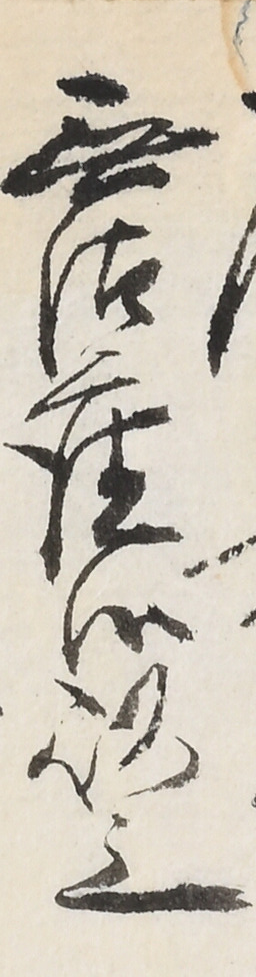無御座候以上
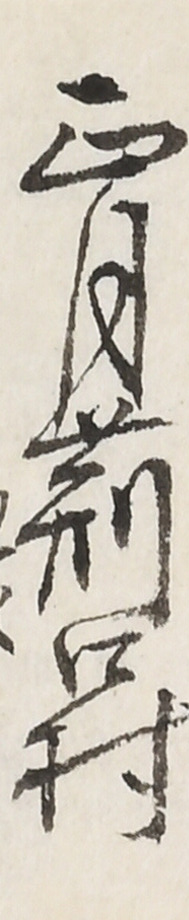正月荊口村
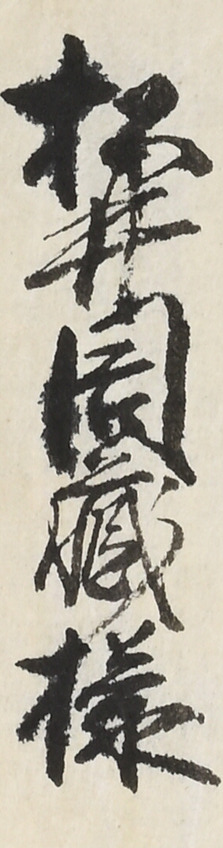松井周蔵様
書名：嘉永五壬子年正月江戸近國石切出稼名前書上帳
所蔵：伊那市立高遠町図書館・合同会社AMANE
